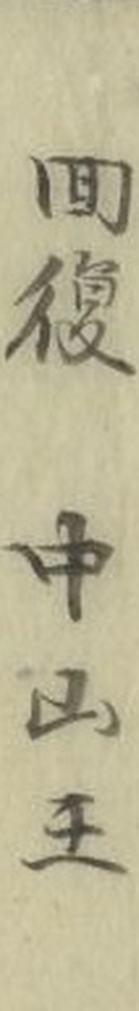回復中山王
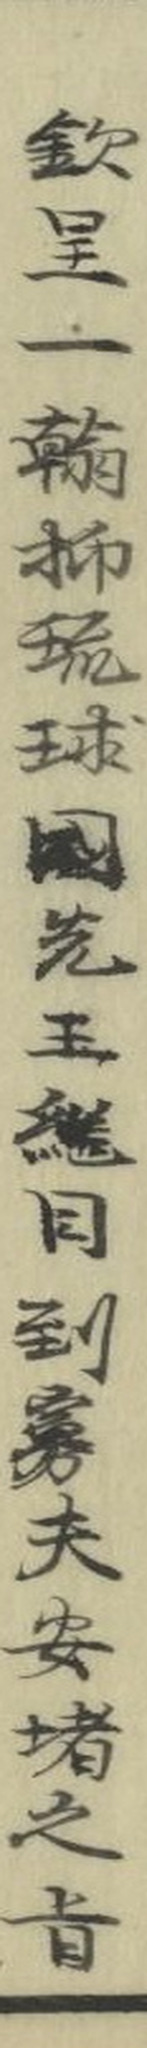謹呈一翰抑琉球国先王継目到寡夫安堵之旨
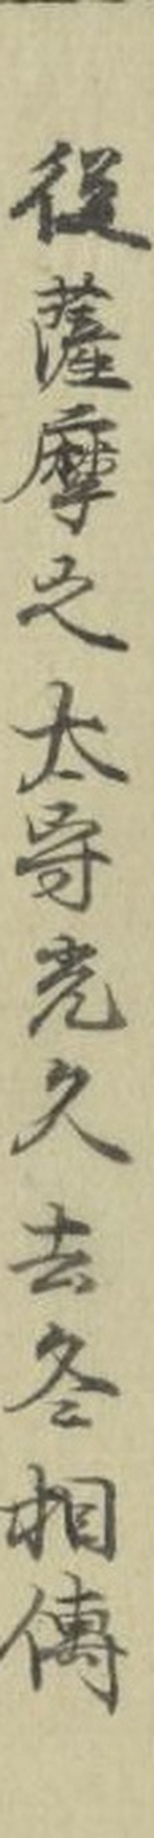従薩摩之太守充久去冬相伝
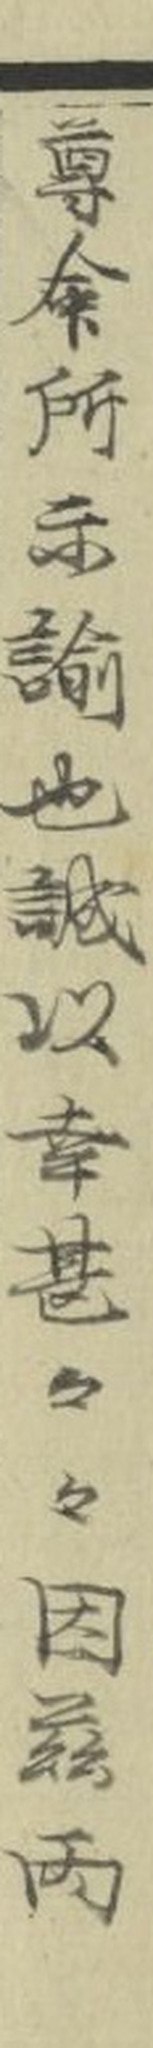尊命所示論也誠以幸甚々々因茲両
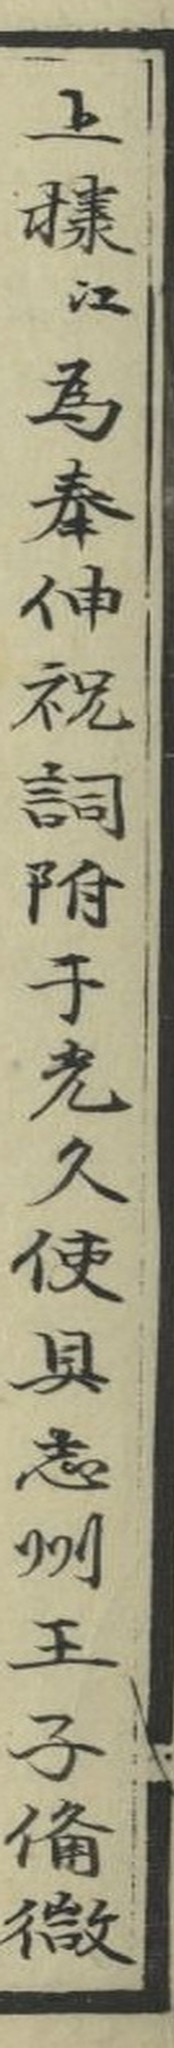上様え為奉伸祝詞附于充久使具志州王子備徴
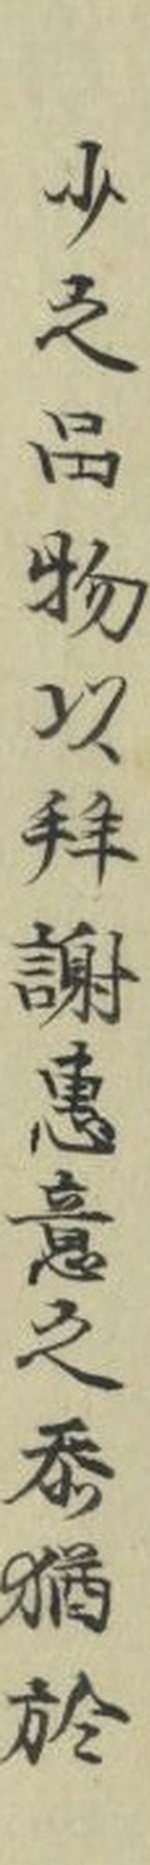少之品物以拝謝恵意之忝猶於
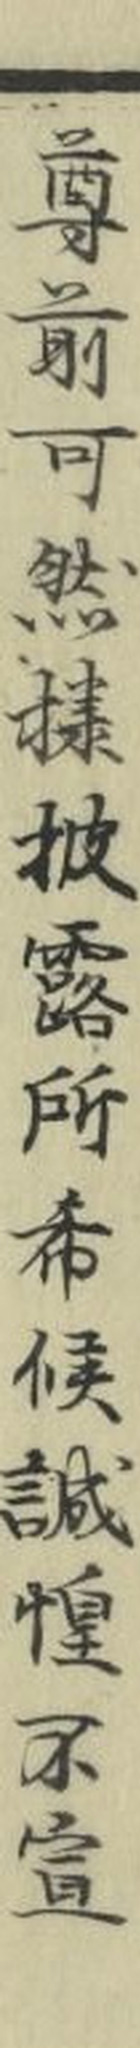尊前可然様披露所希候誠惶不宣
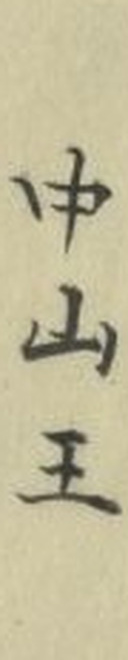中山王
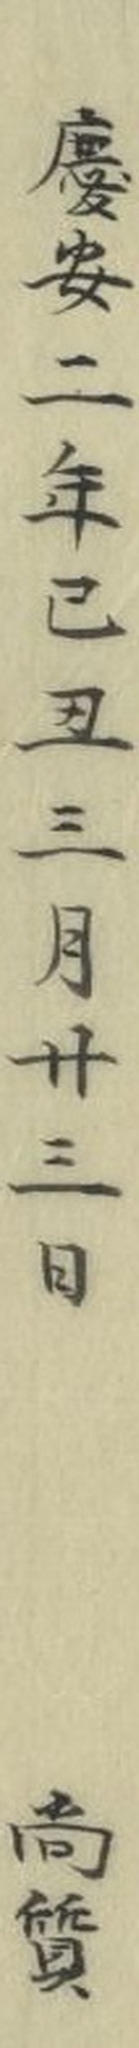慶安二年巳丑三月廿三日尚質
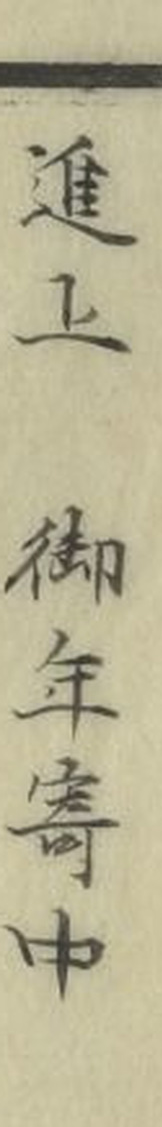進上御年寄中
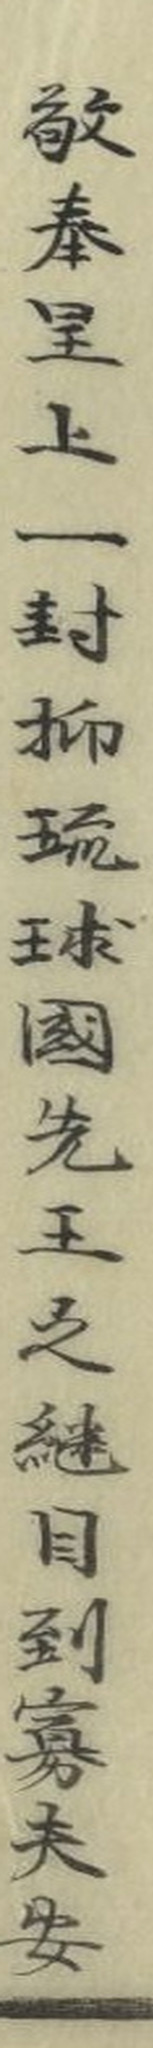敬奉呈上一対抑琉球国先王之継目到寡夫安
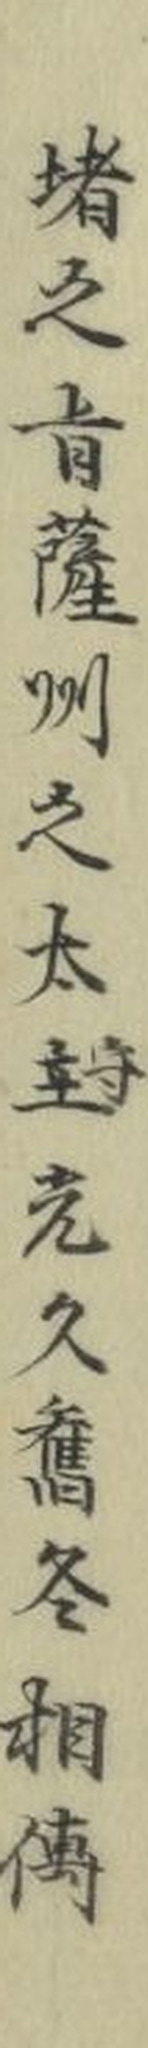堵之旨薩州之太守充久旧冬相伝

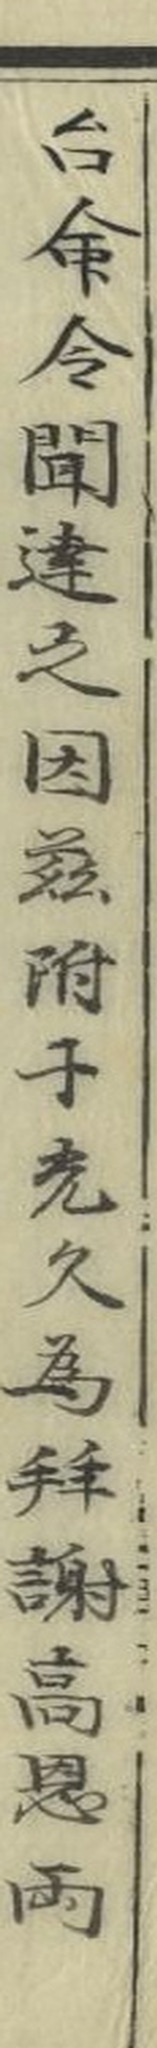台命令聞違之因茲附于充久為拝謝高恩両
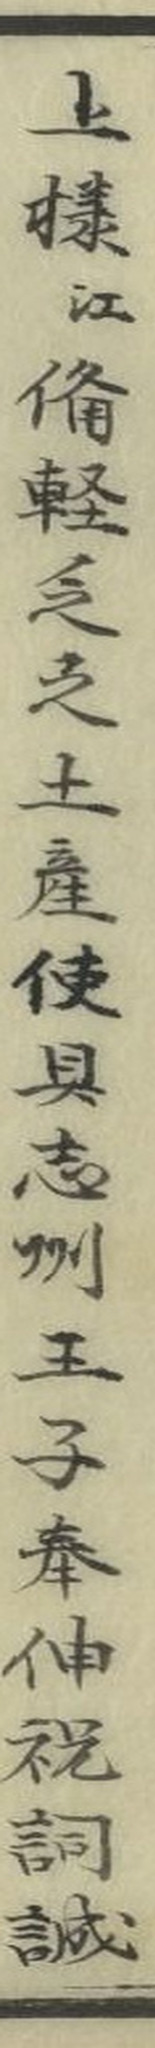上様え備軽乏之土産使具志州皇子奉伸祝詞誠
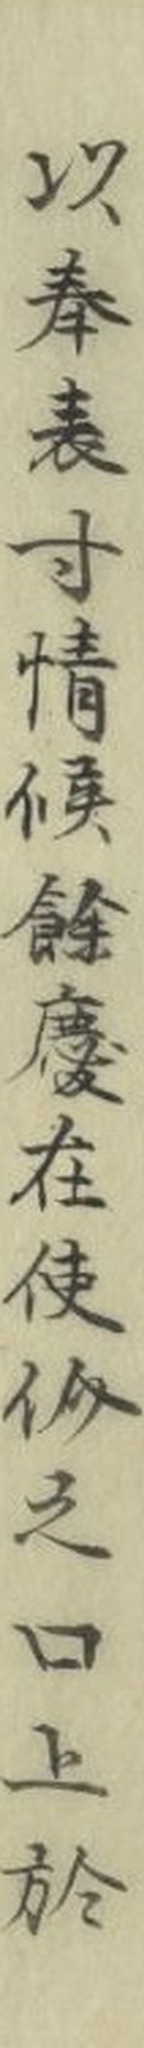以奉表寸情候余慶在使价之口上於
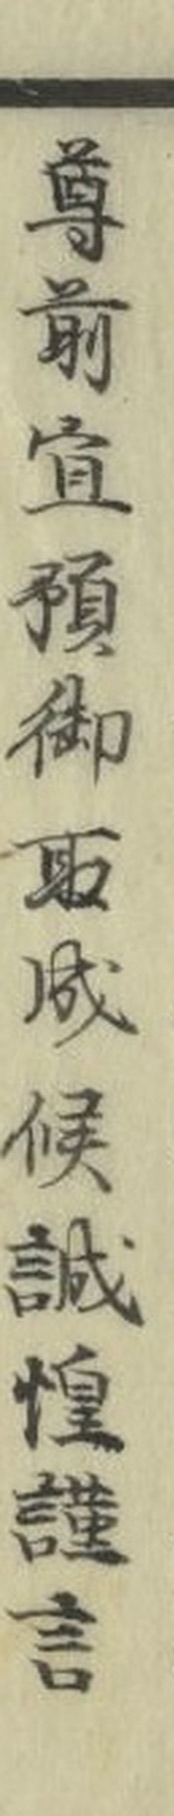尊前冝預御取成候誠惶謹言
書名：琉球往来（上）
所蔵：University of the Ryukyus Library
